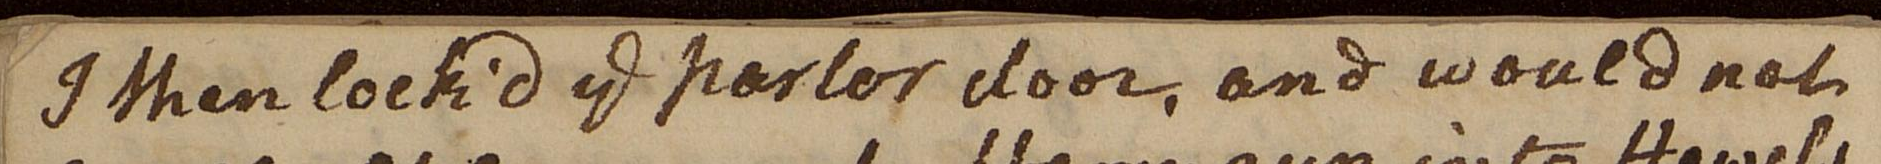I then lock'd y^e parlor door, and would not
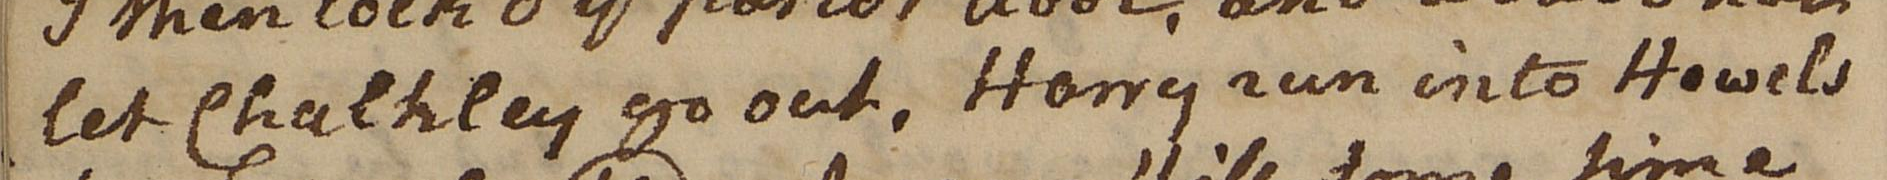let Chalkley go out, Harry run into Howels
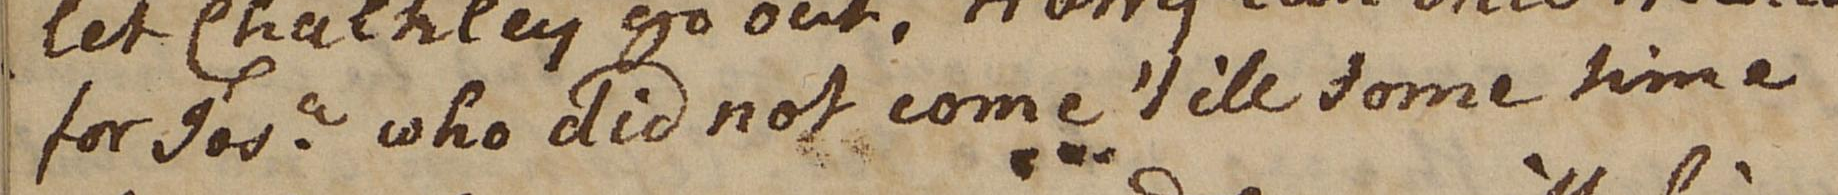for Jos^a. who did not come 'till some time
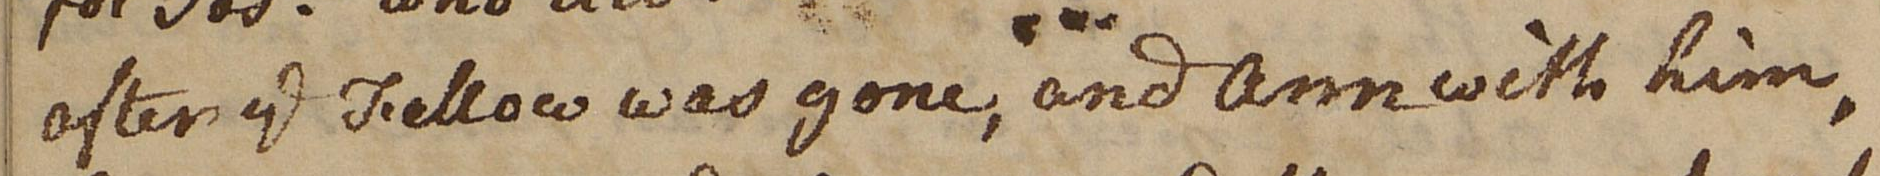after y^e Fellow was gone, and Ann with him,
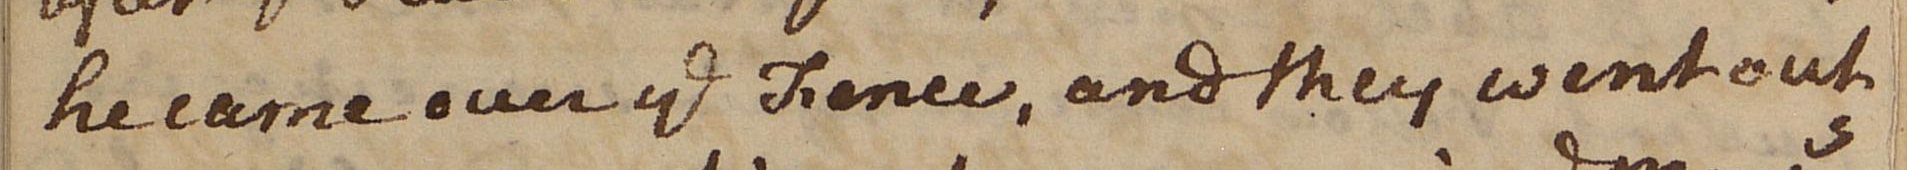he came over y^e Fence, and they went out
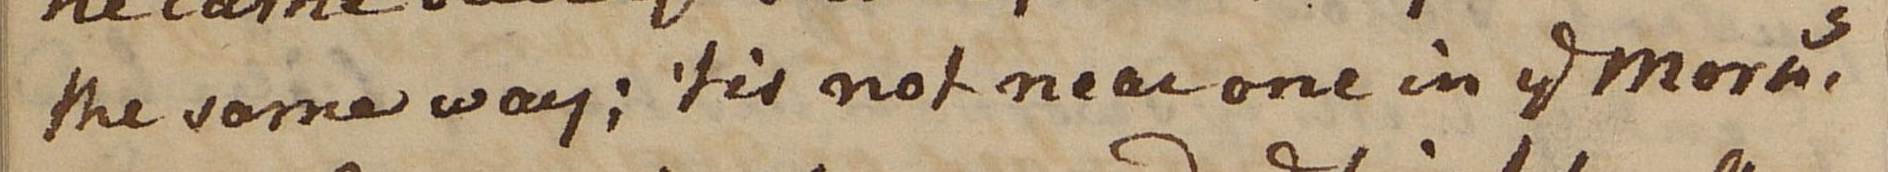the same way; 'tis not near one in y^e Morn^g.
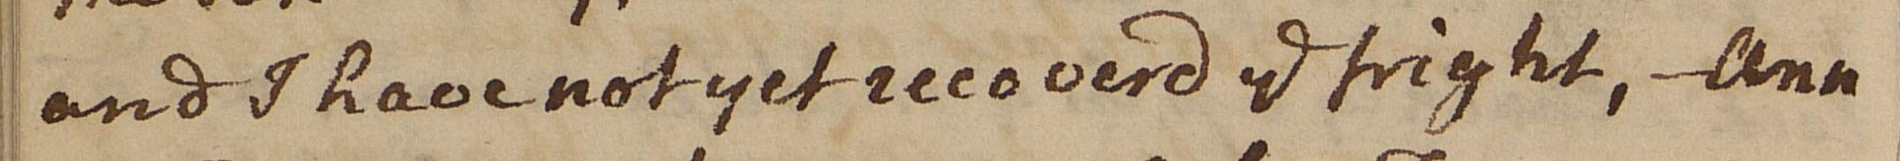and I have not yet recoverd y^e fright,- Ann
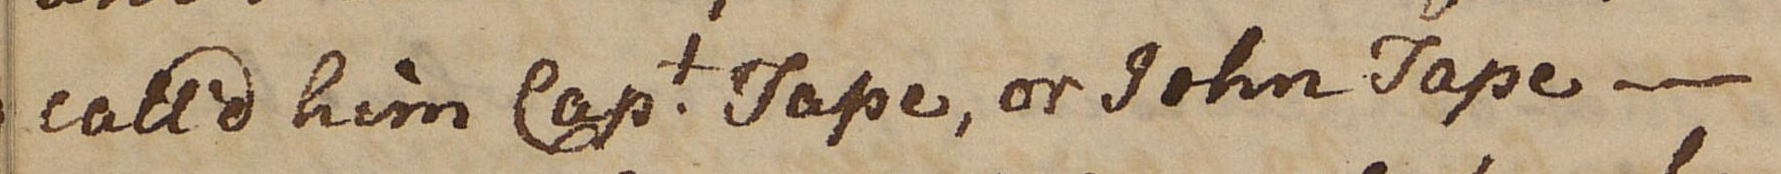call'd him Cap^t. Tape, or John Tape-
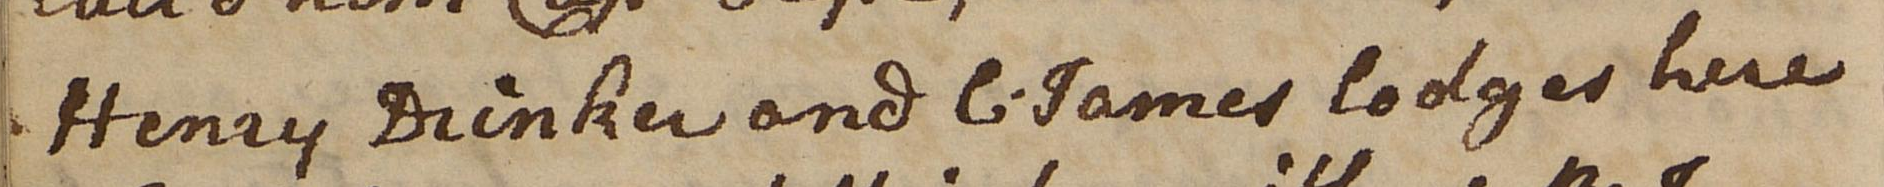Henry Drinker and C. James lodges here
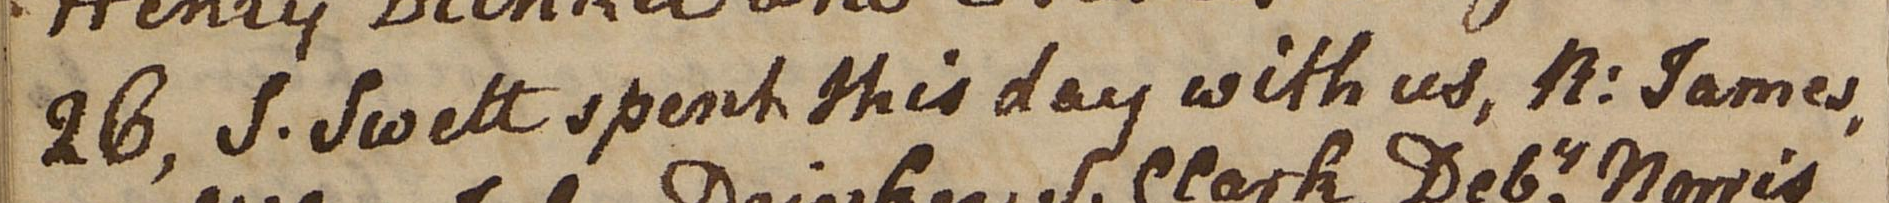28, S. Swelt spent this day with us, N: James,
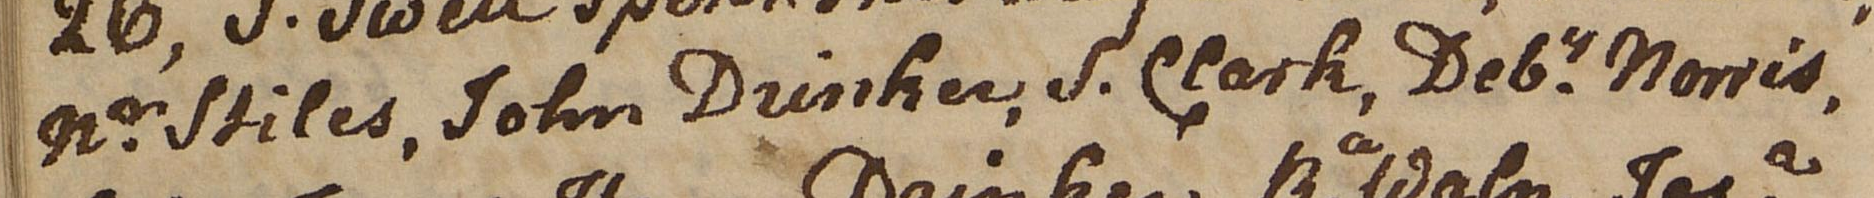N^r. Stiles, John Drinker, S. Clark, Deb^y. Norris,
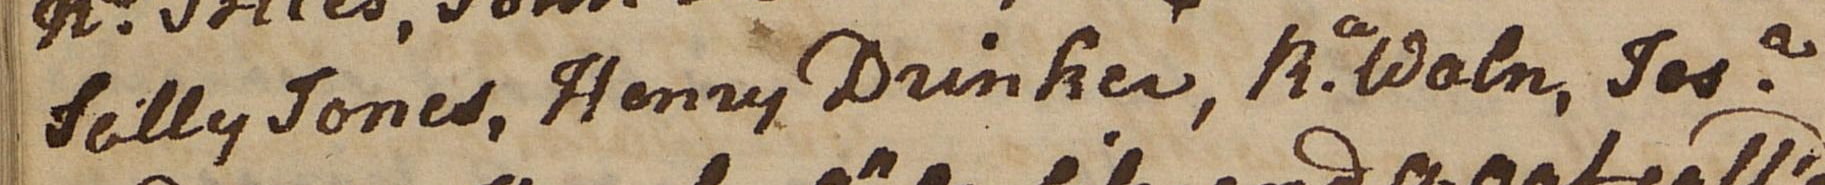Sally Jones, Henry Drinker, R^a. Waln, Jos^a.
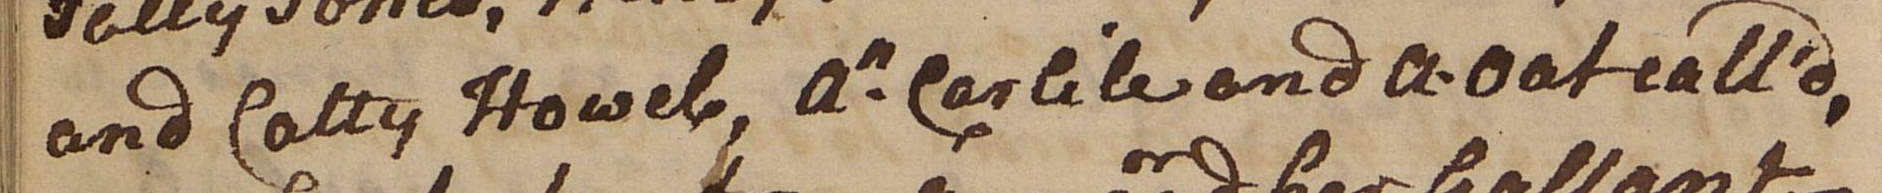and Catty Howel, A^n. Carlile and A. Oat call'd,
